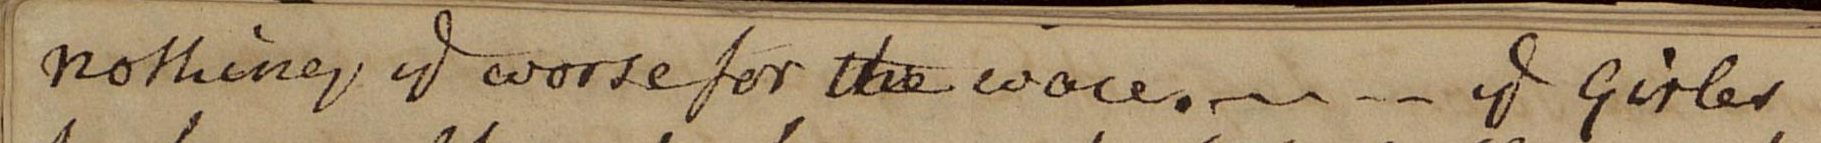nothing y^e worse for the ware.--- y^e Girles
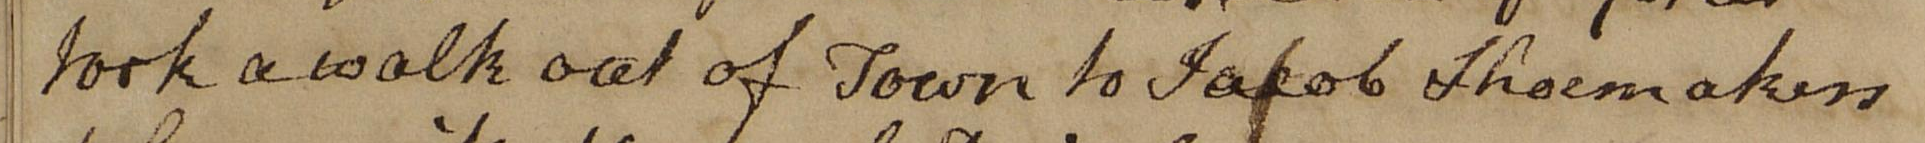took a walk out of Town to I Jacob Shoemakers
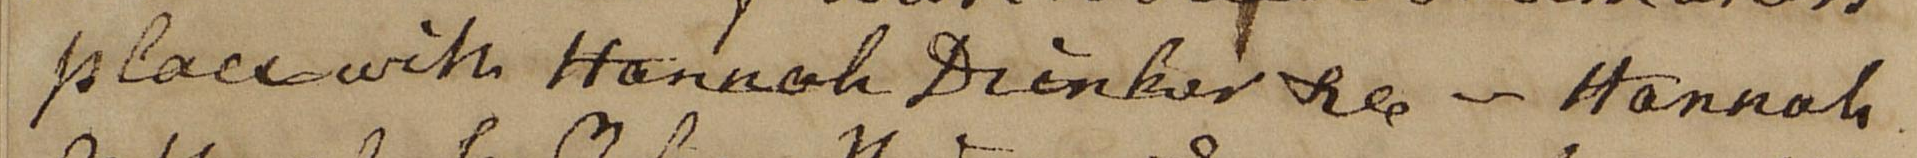place with Hannah Drinker &c- Hannah
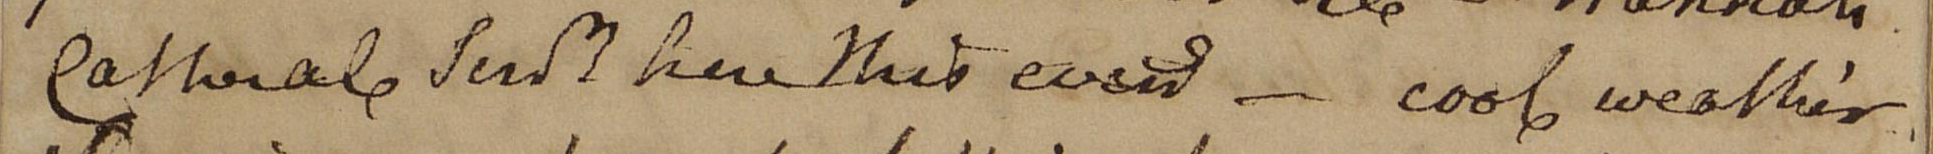Catheral Sen^r. here this even^g- cool weather
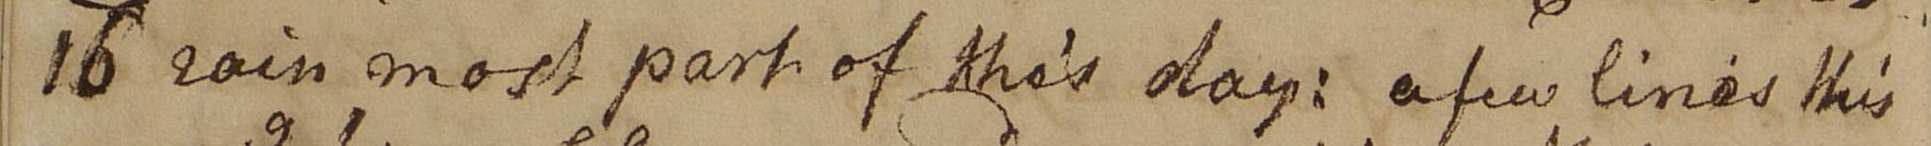16 rain most part of this day: a few lines this
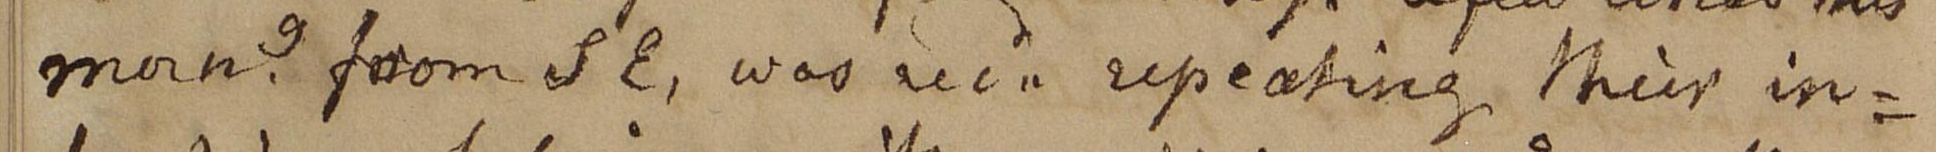morn^g. from SE, was rec^d.. repeating their in-
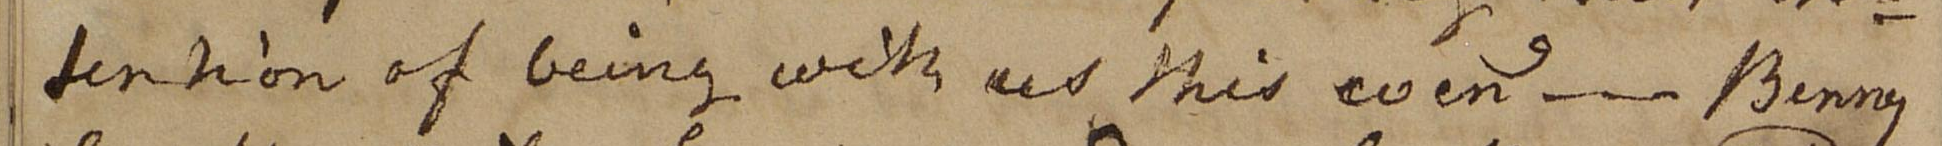tention of being with us this even^g- Benny
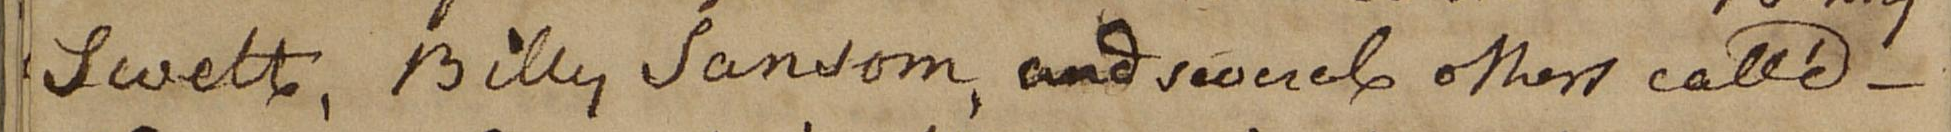Swett, Billy Sansom, and several others call'd-
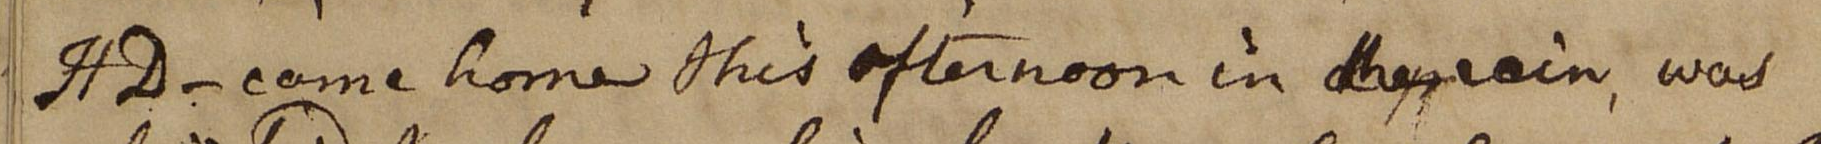HD. came home this afternoon in the rain, was
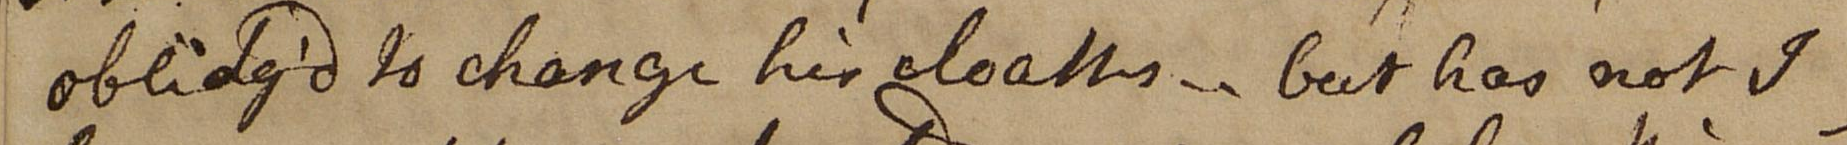oblidg'd to change his cloalhs- but has not I
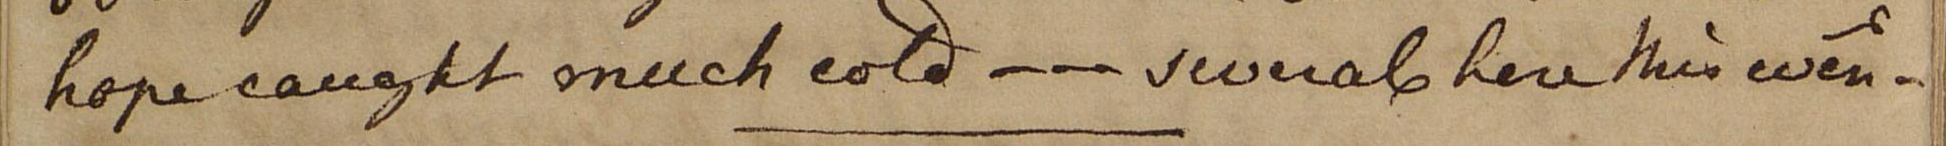hope caught much cold-- several here this even^g-
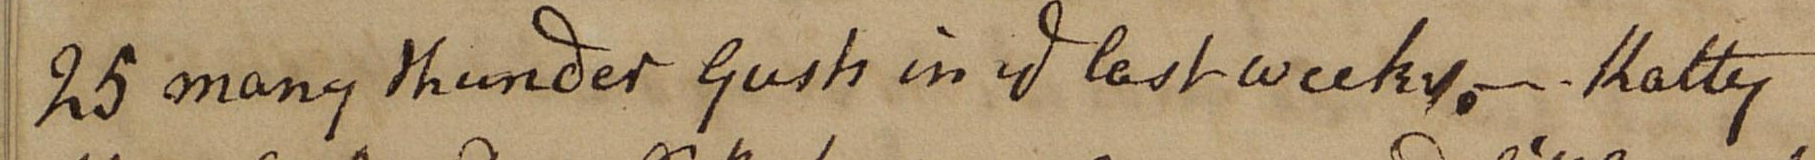25 many thunder Gusts in y^e last weeks.- Katty
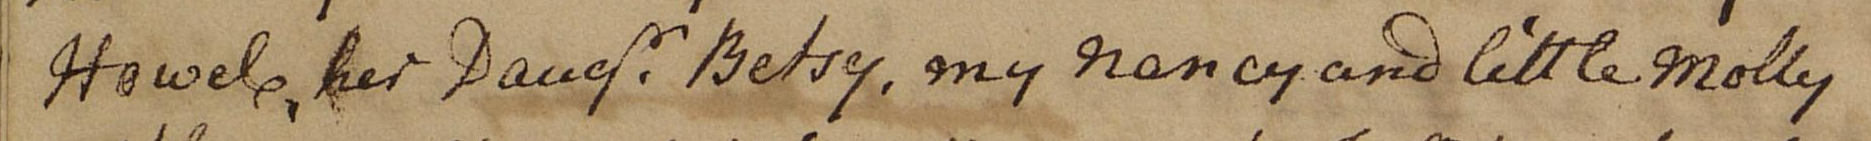Howel, her Daug^r. Betsy, my Nancy and little Molly
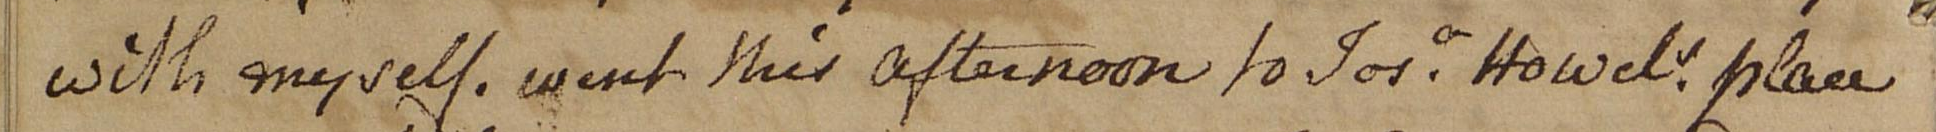with myself, went this afternoon to Jos^a. Howel^s. place
